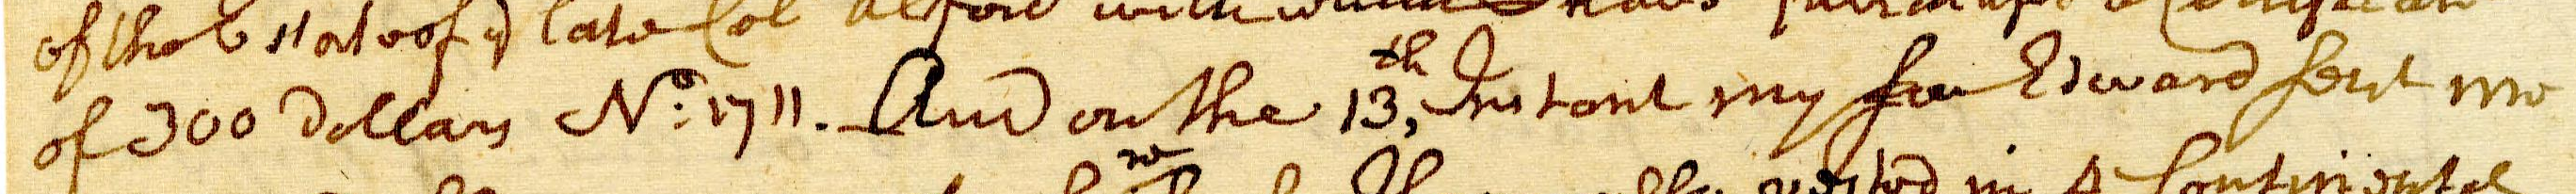of 300 dollars N^o: 1711. And on the 13^th, Instant my son Edward sent me
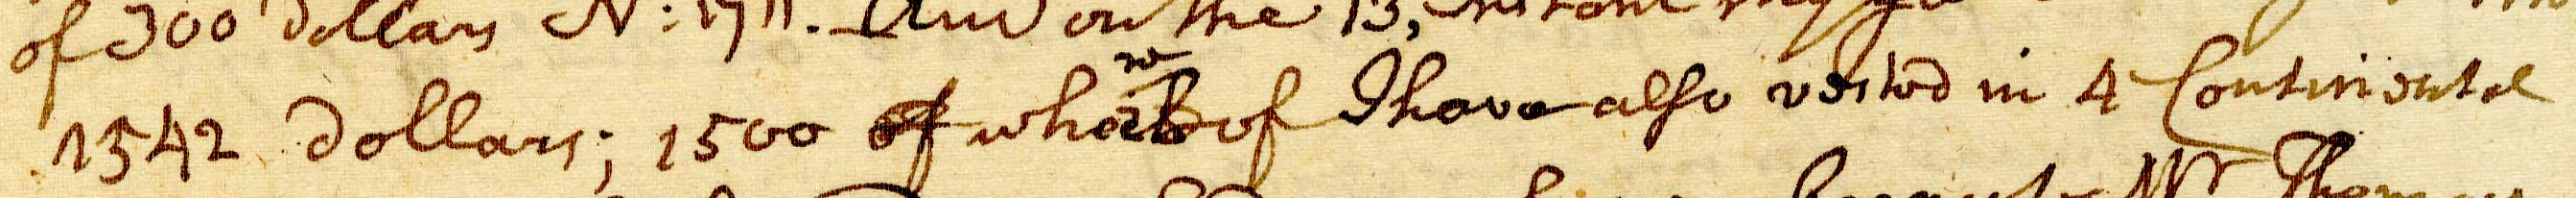2542 dollars; 1500 [of] [which] of I have also vested in 4 Continental
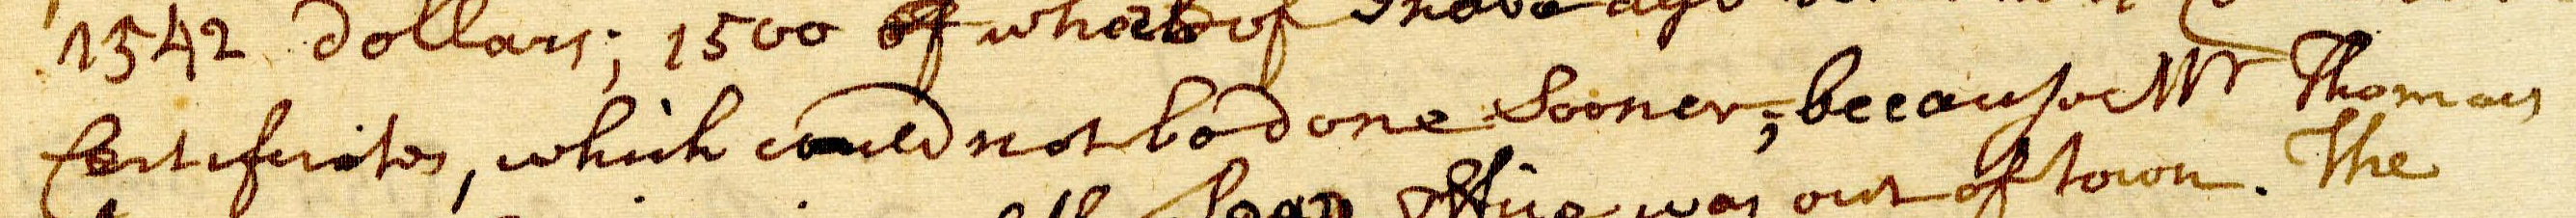Certificates, which could not be done Sooner; because M^r Thomas
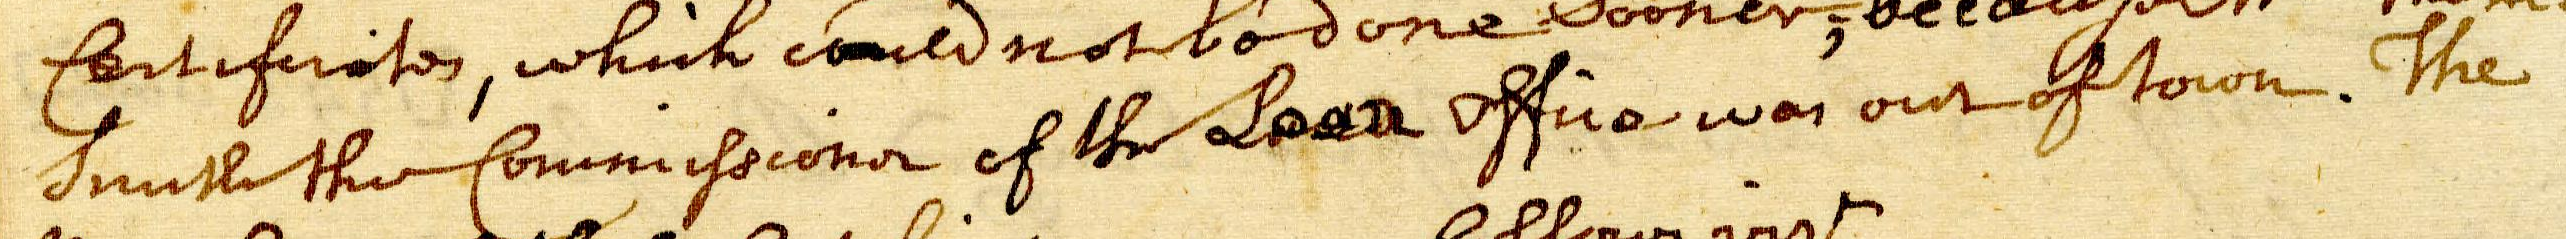Smith the Commissioner of the Loan office was our of town. The
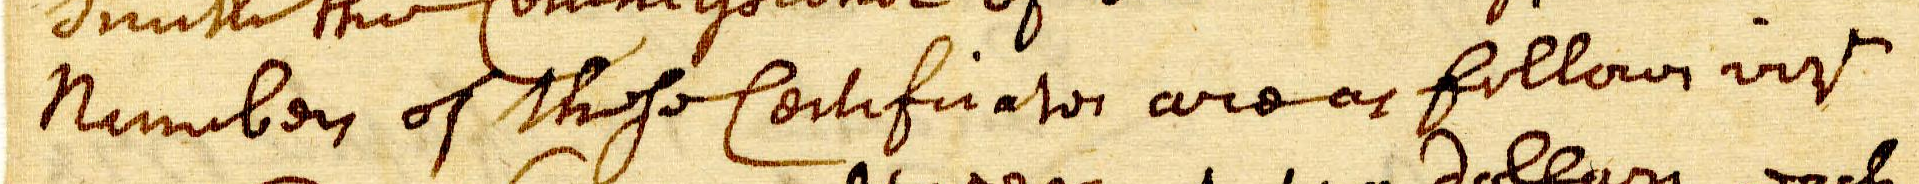Numbers of these Certificates are as fellows viz^t
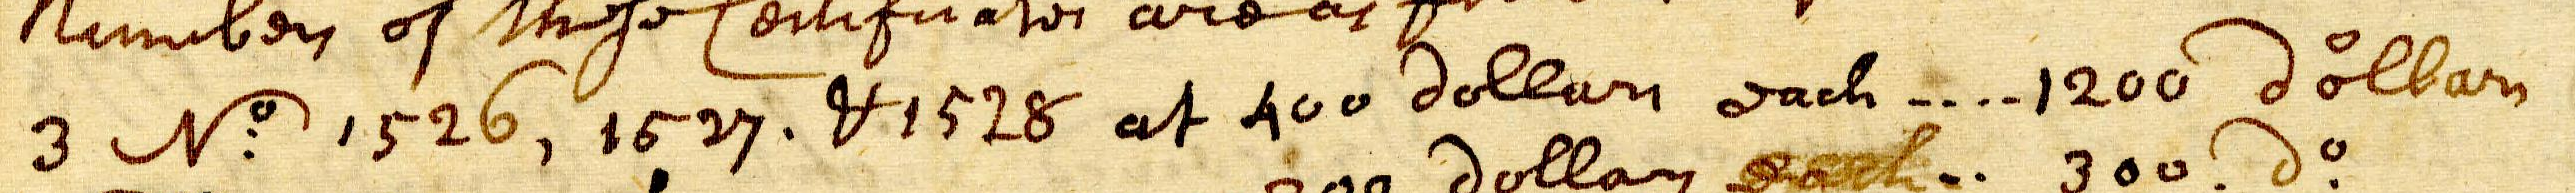3 N^o: 1526, 1527. & 1528 at 400 dollars each----1200 dollars
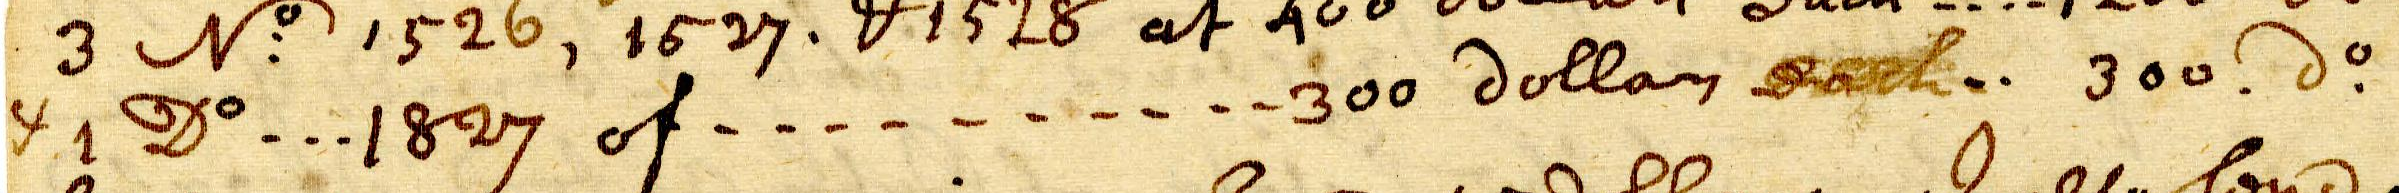& 1 D^o---1827 of---------- 300 dollars [each] the 300. d^o.
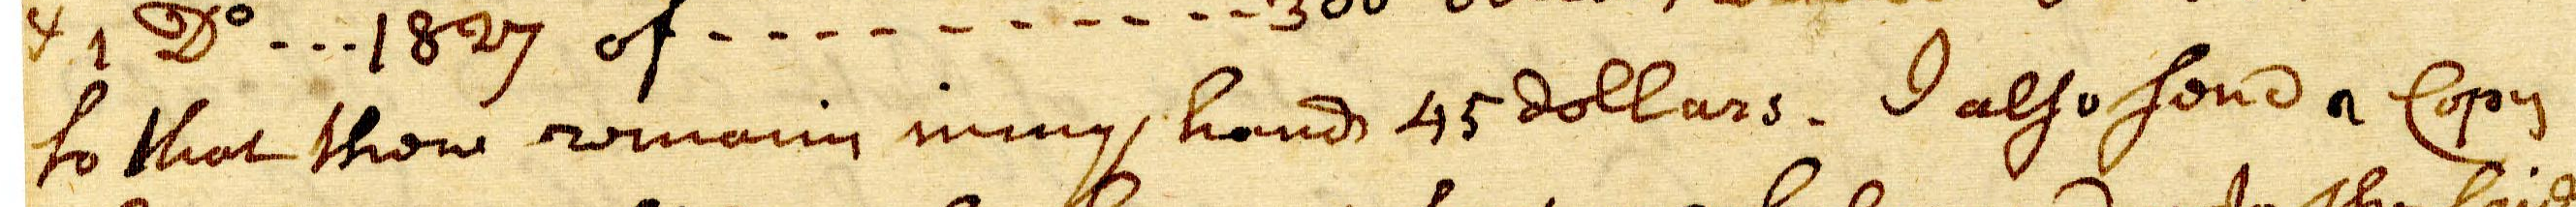so that there remains in my hands 45 dollars. I also send a Copy
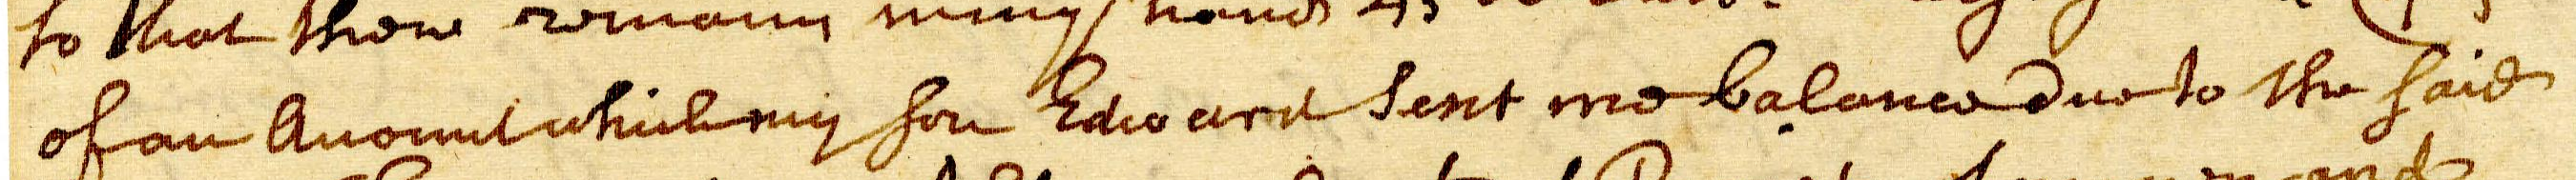of an Account which my son Edward sent me balances due to the said
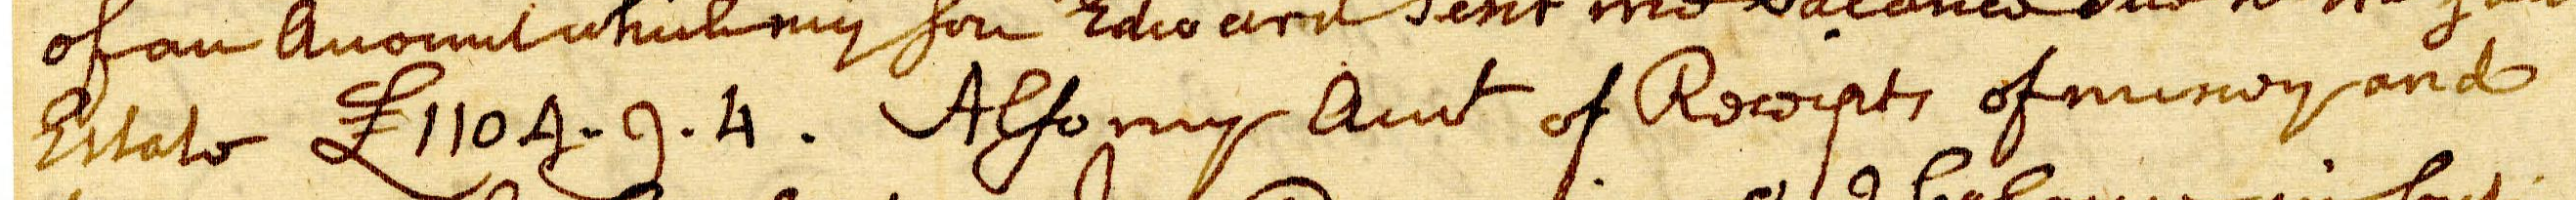Estate £1104.9.4. Also my Act of Receipts of money and
